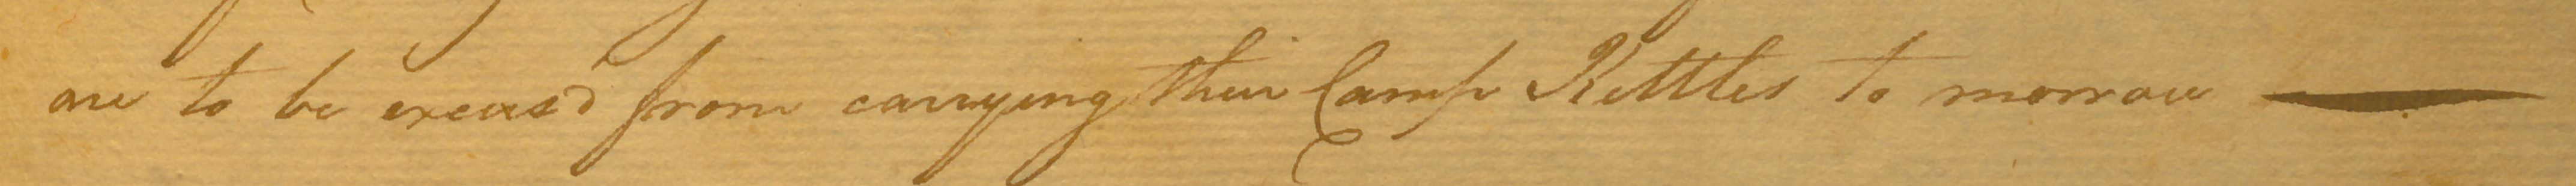are to be excusd from carrying their Camp Kettles to morrow-
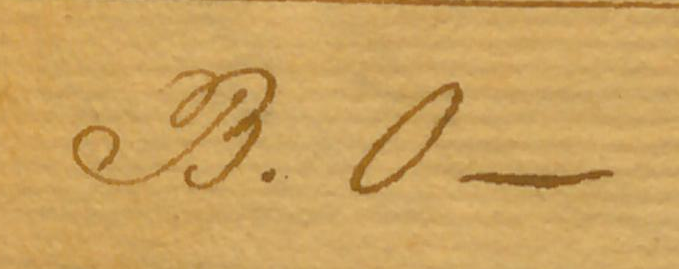B.O-
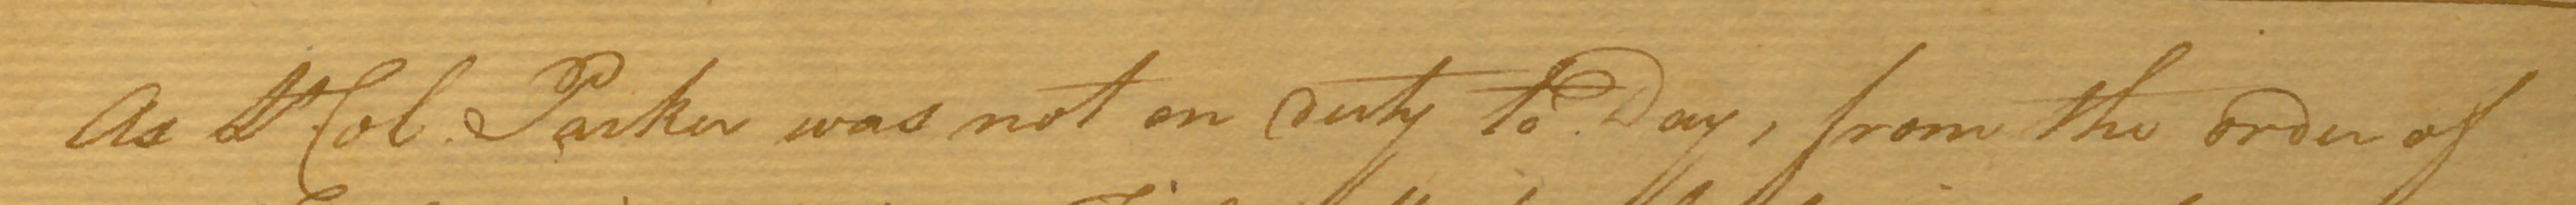As L^t. Col. Parker was not on duty to Day, from the order of
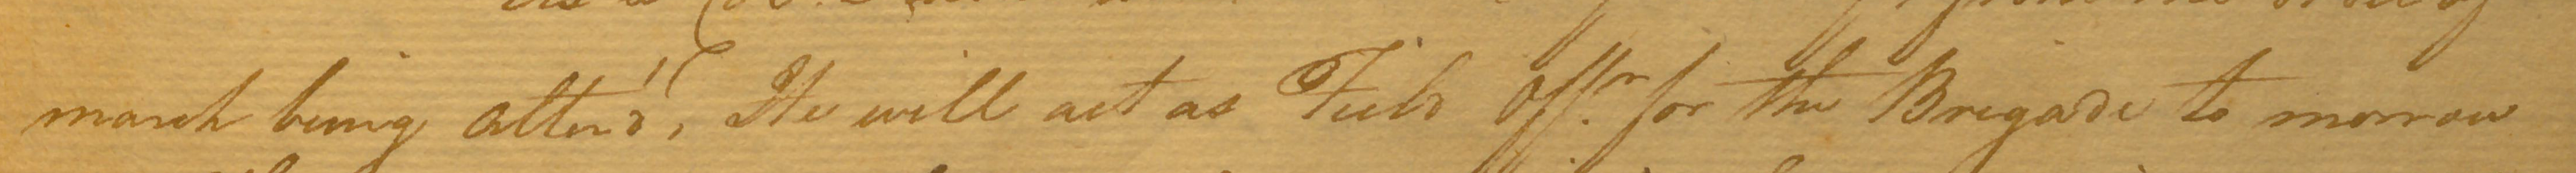march being alter'd, He will act as Field Off^r for the Brigade to morrow
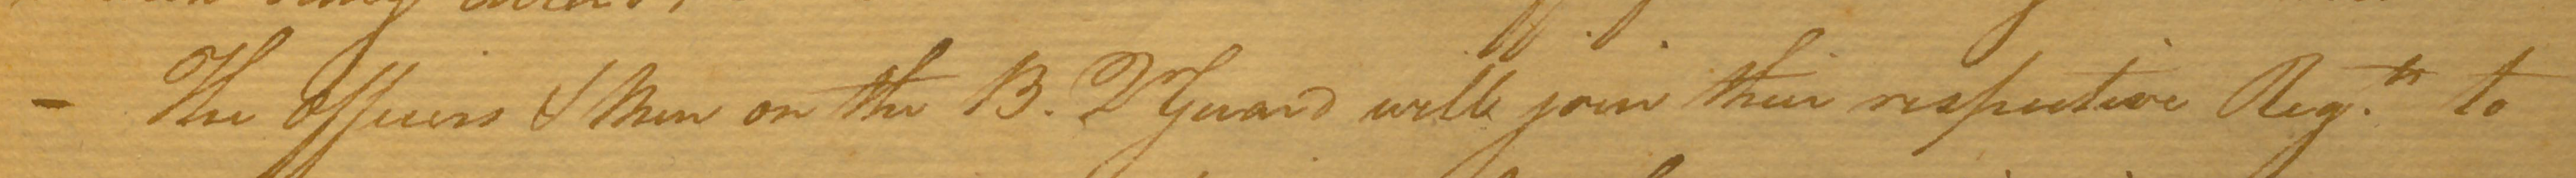-The Officers & Men on the B. Q^r Guard will join their respective Reg^ts. to
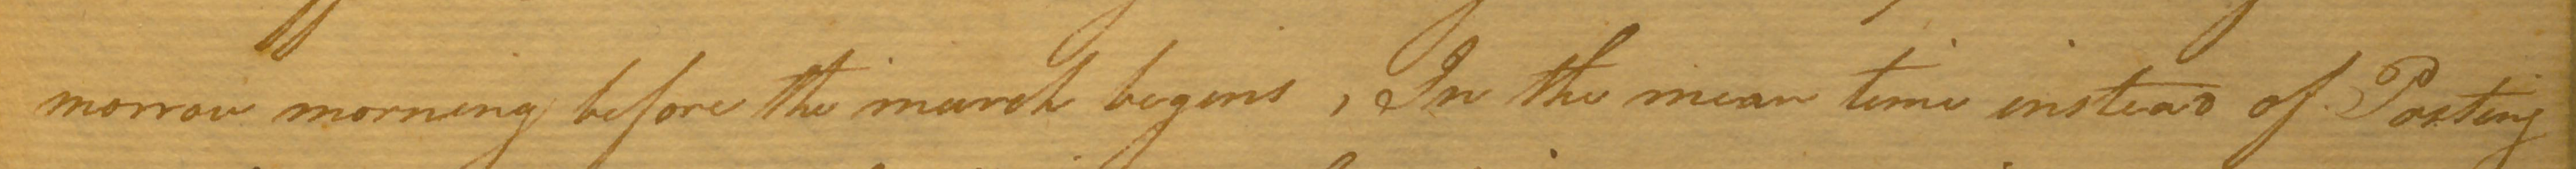morrow morning before the march begins, In the mean time instead of Posting
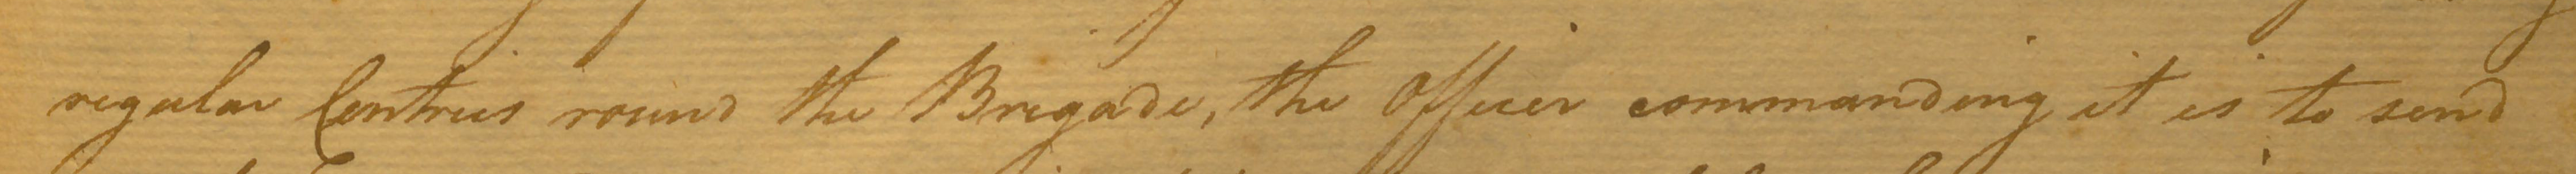regular Centries round the Brigade, the officer commanding it is to send
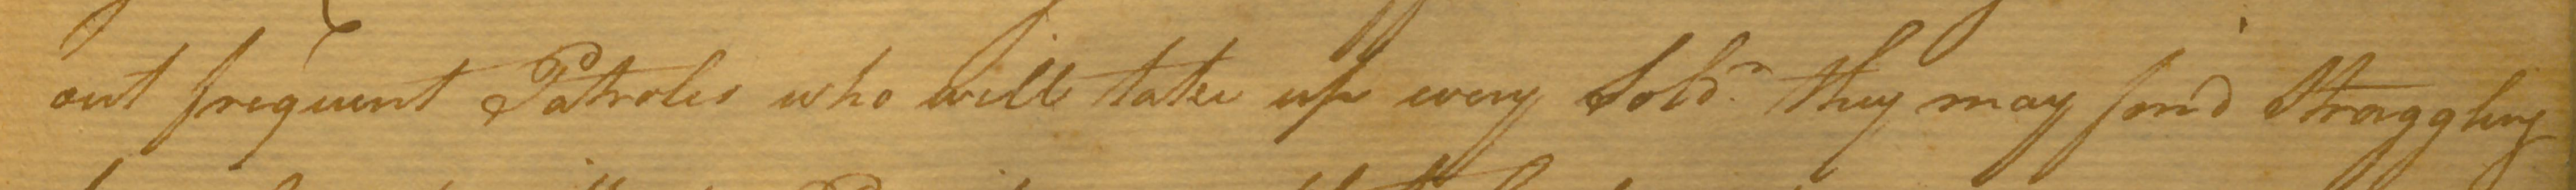out frequent Patroles who will take up every Sold^r. they may find Straggling
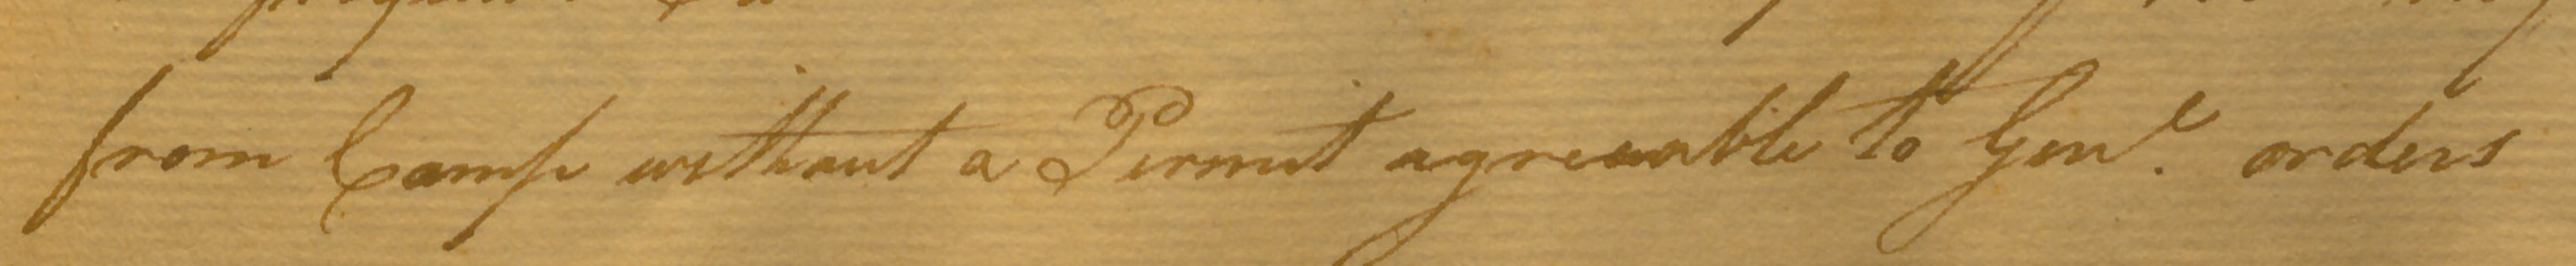from Camps without a Permit agreeable to Gen^l. orders
